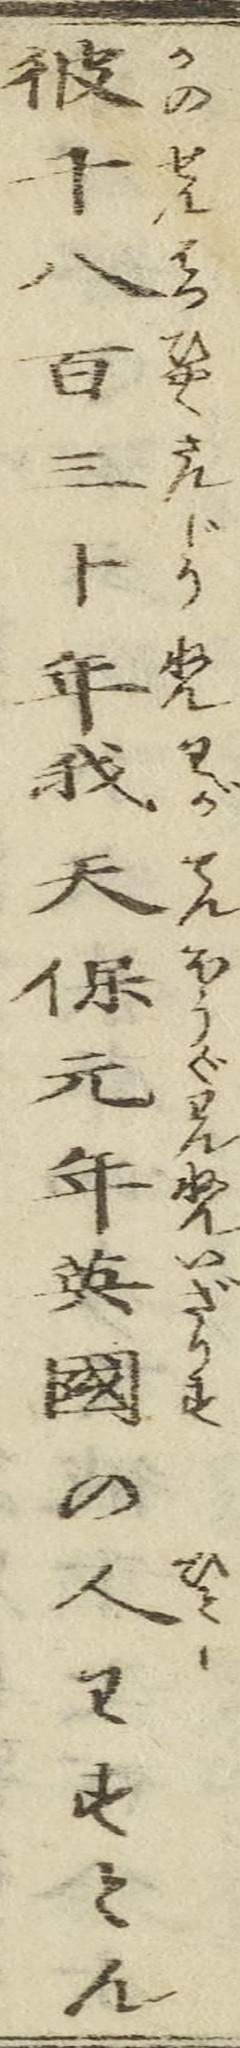彼千八百三十年我天保元年英国の人「わすとん
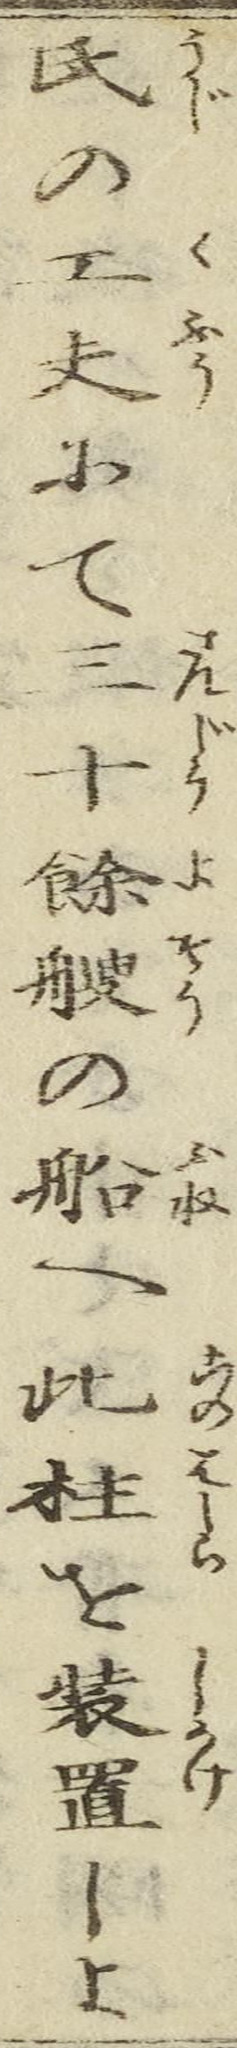氏の工夫にて三十余艘の船へ此柱を装置しよ
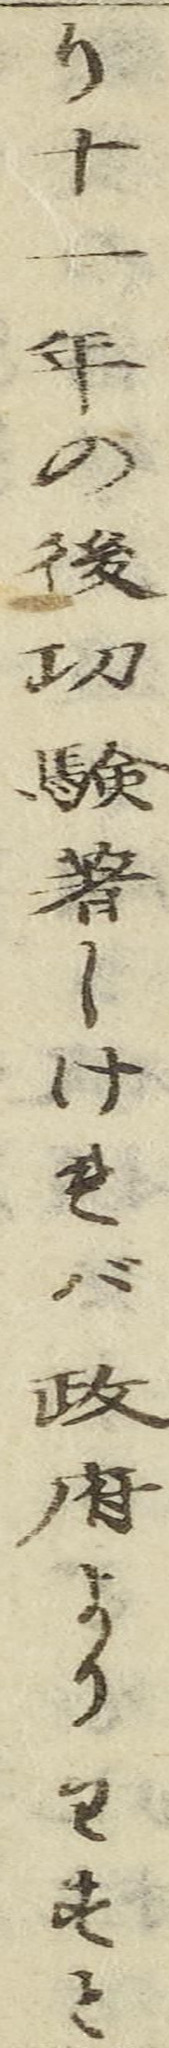り十一年の後功験著しければ政府より「わすと
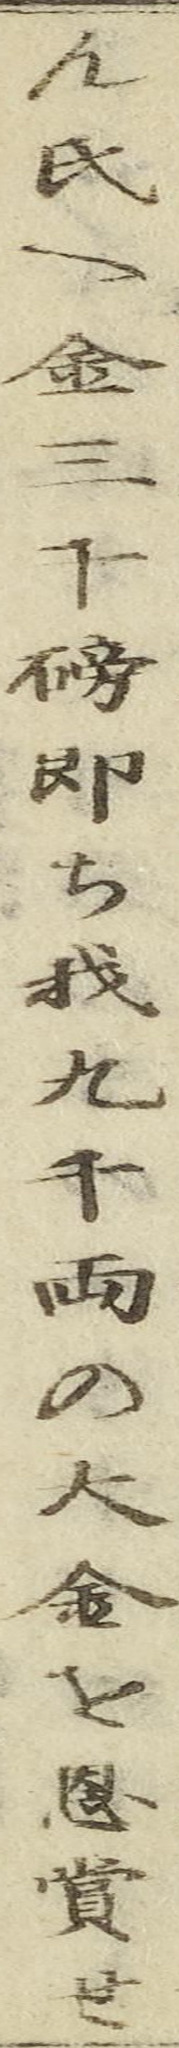ん氏へ金三千磅即ち我九千両の大金を恩賞せ
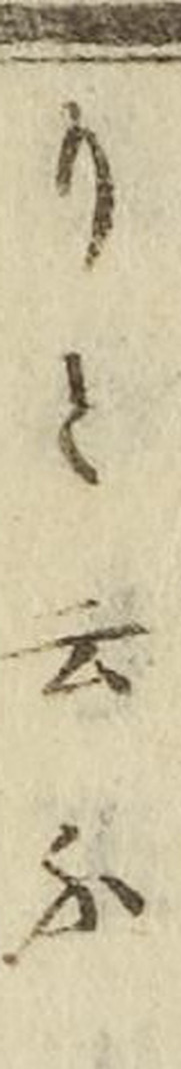りと云ふ
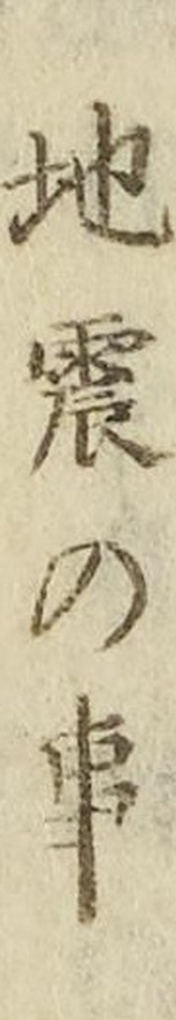地震の事
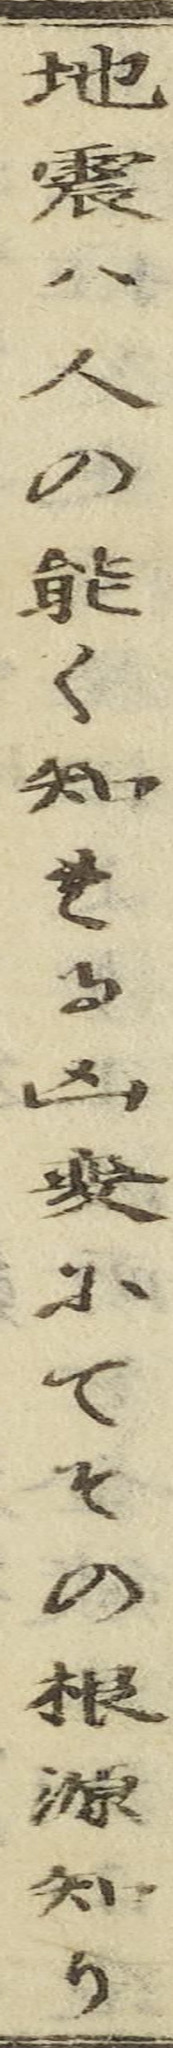地震は人の能く知れる凶変にてその根源知り
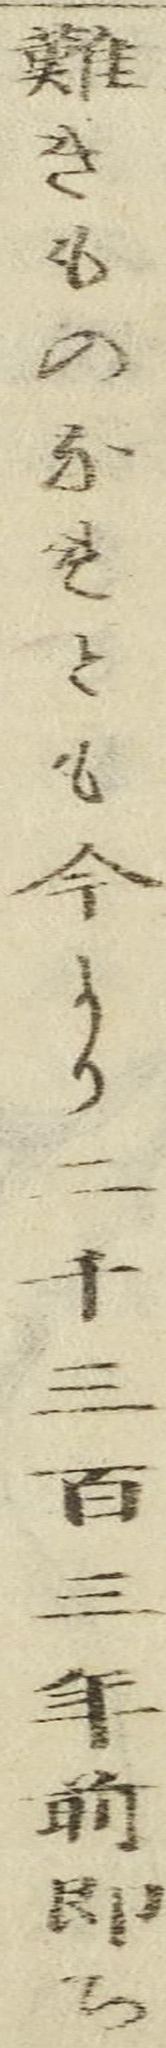難きものなれとも今より二千三百三年前即ち
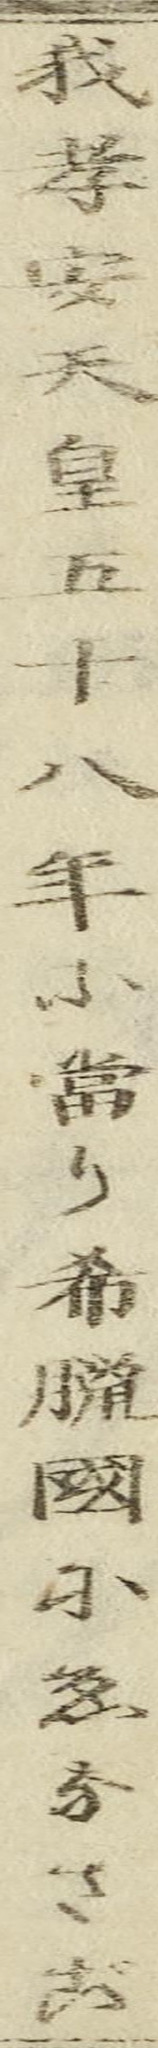我孝安天皇五十八年に当り希臘国に「ゑなさご
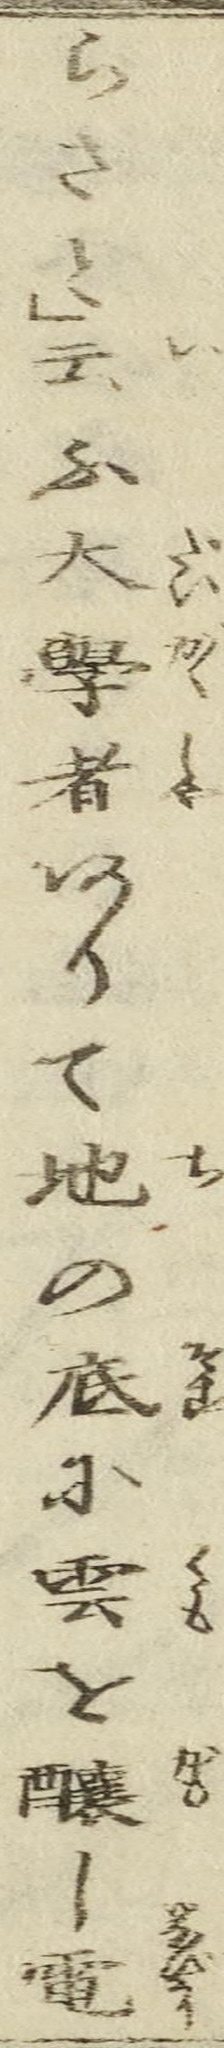らさと」云ふ大学者ありて地の底に雲を醸し電
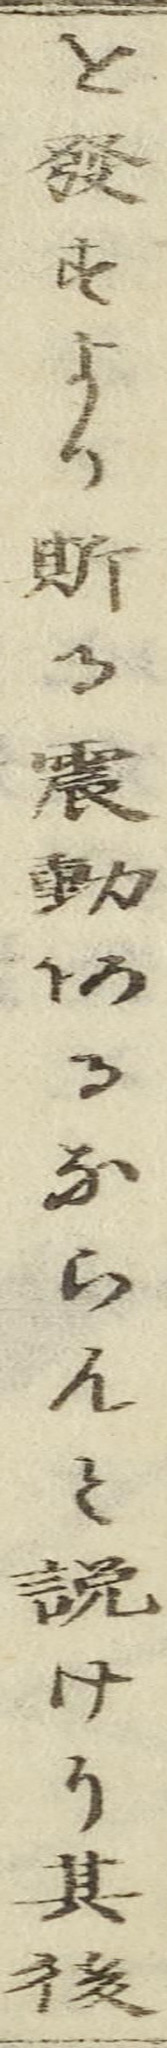を発すより斯る震動あるならんと説けり其後
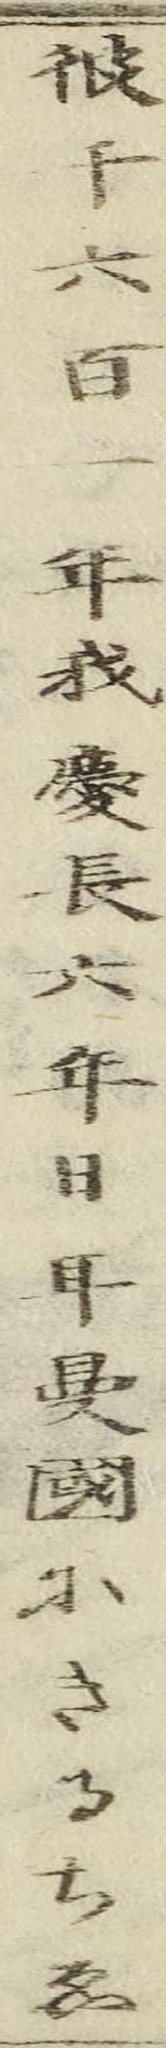彼千六百一年我慶長六年日耳曼国に「きるちゑ
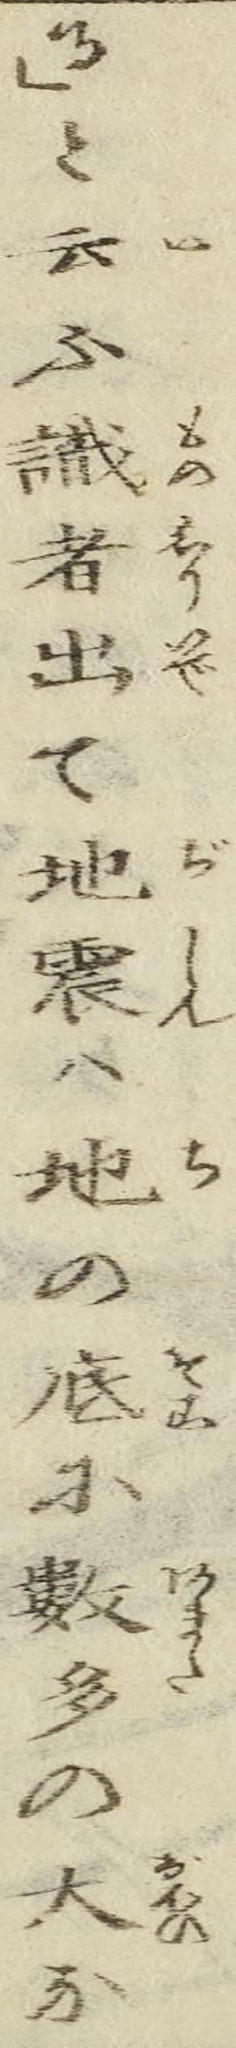る」と云ふ識者出て地震は地の底に数多の大な
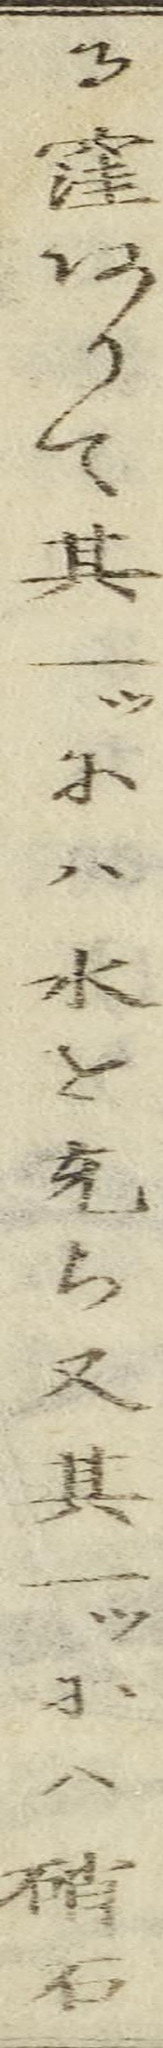る窪ありて其一ツには水を充ち又其一ツには硝石
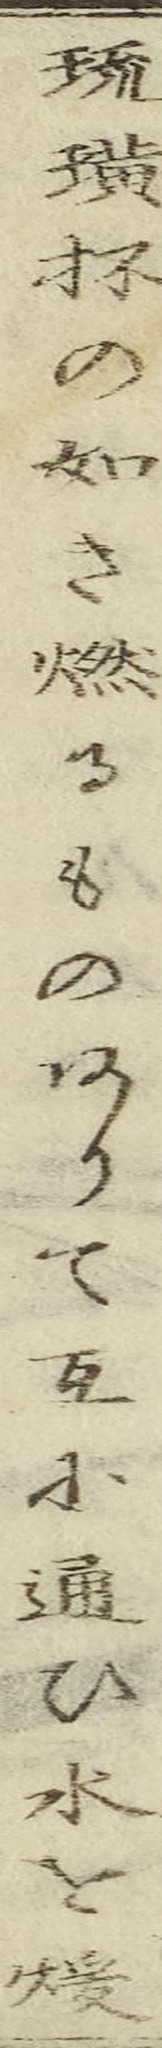琉璜抔の如き燃るものありて互に通ひ水を煖
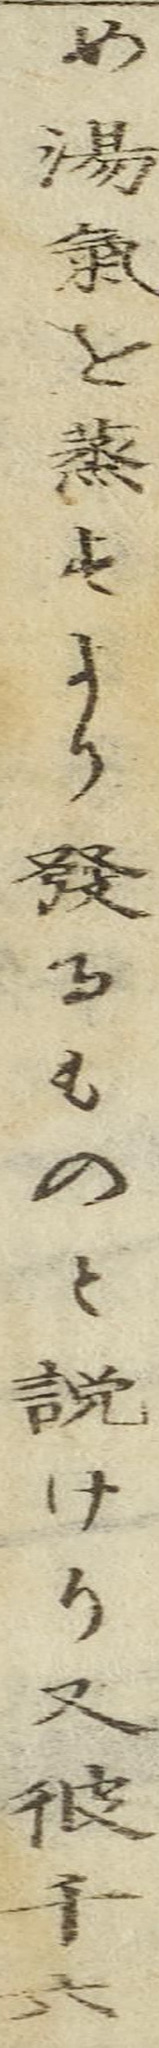め湯気を蒸すより発るものと説けり又彼千六
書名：天変地異
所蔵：東京大学地震研究所図書室 Earthquake Research Institute Library, The University of Tokyo, JAPAN
